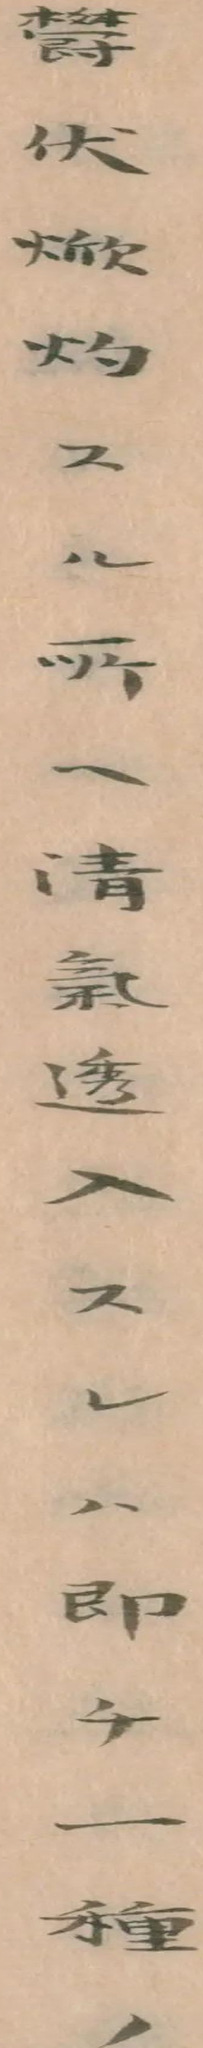欝伏燃灼スル所へ清気透入スレハ即チ一種ノ
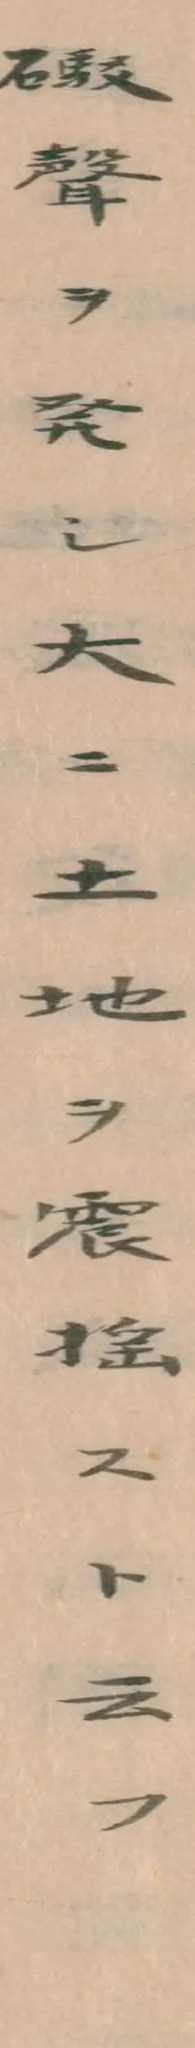欝声ヲ発しシ大二栃ヲ震揺スト云
